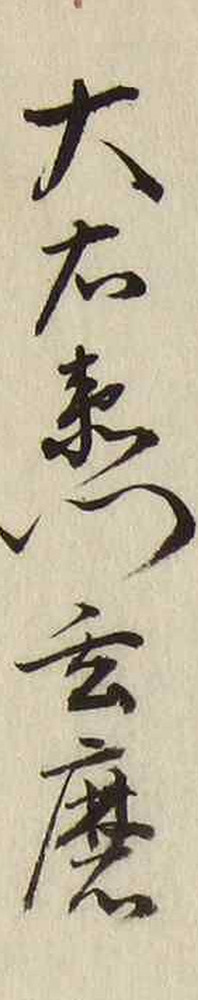大右衛門玄磨

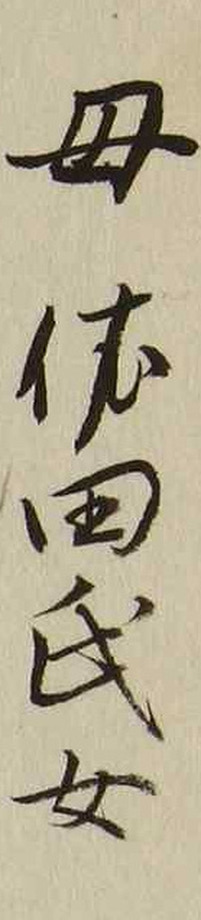母依田氏女
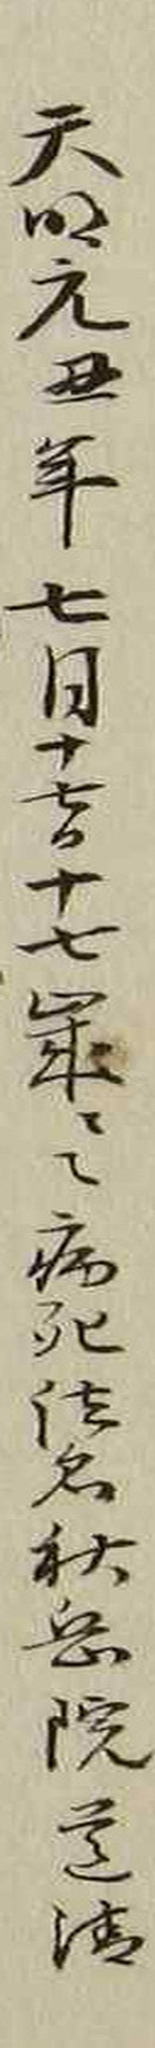天明元丑年七月十七日十七歳ニて病死法名秋岳院
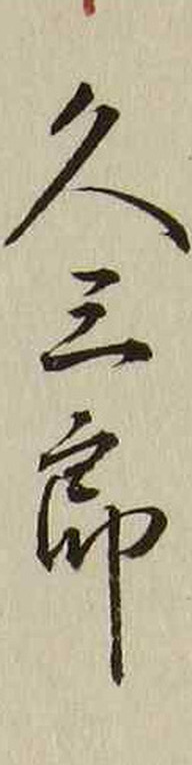久三郎
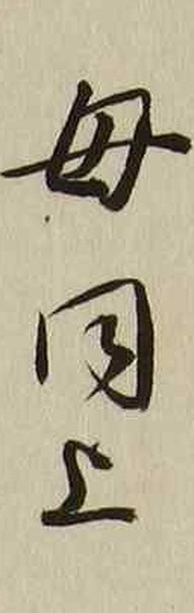母同上
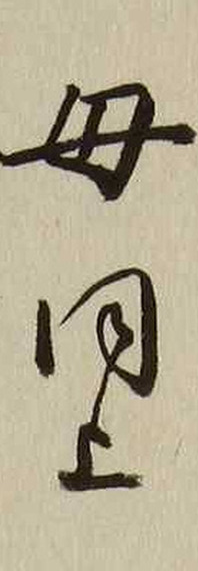母同上
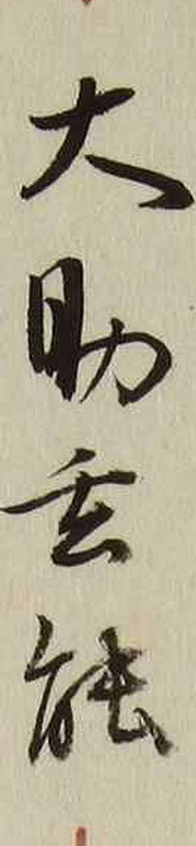大助玄能
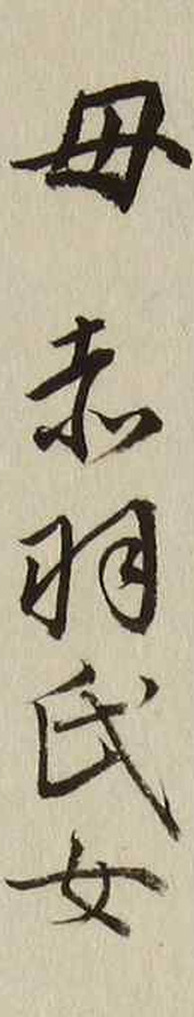母赤羽氏女
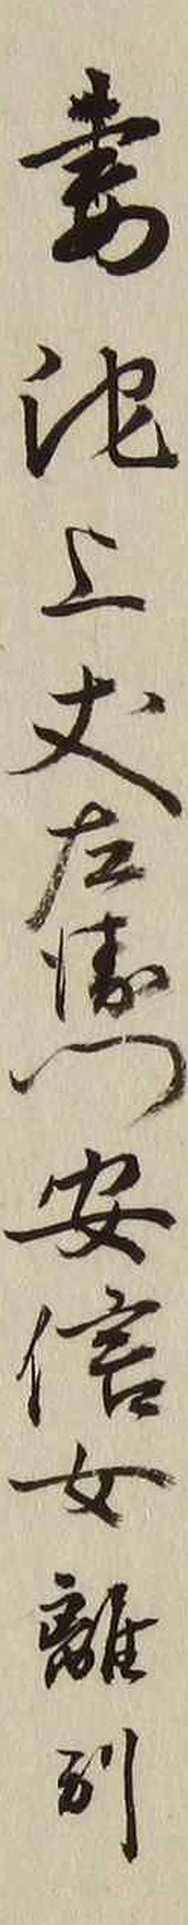妻池上丈左衛門安信女離別
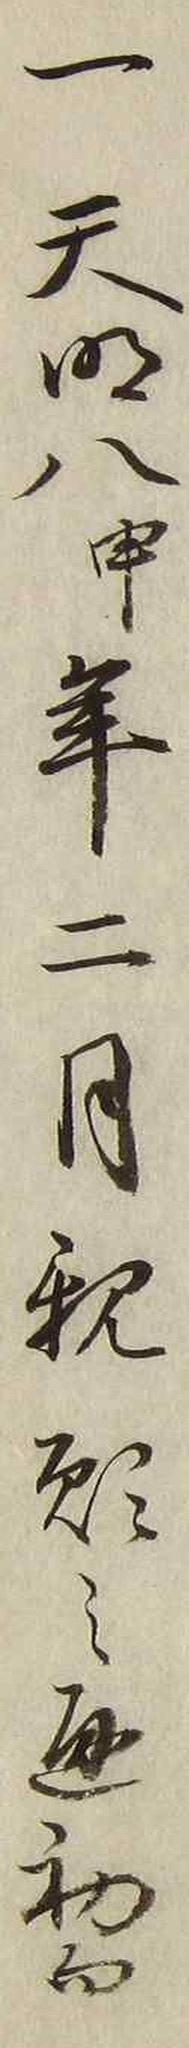一天明八申年二月親願い之通初めて

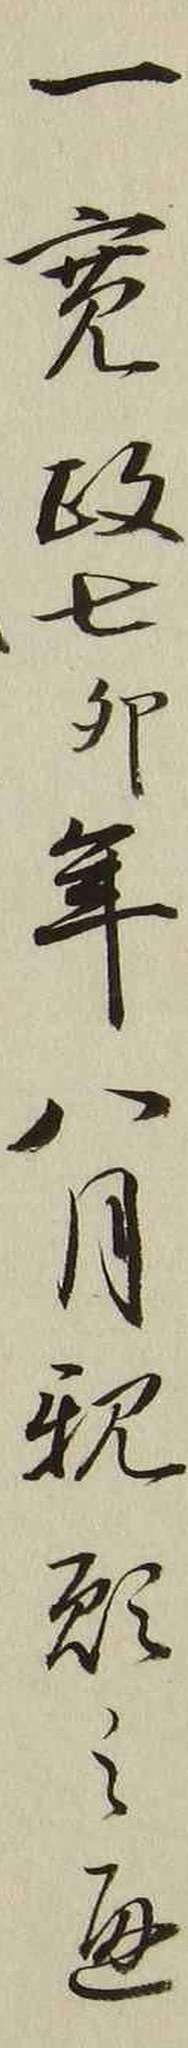一寛政七卯年八月親願い之通
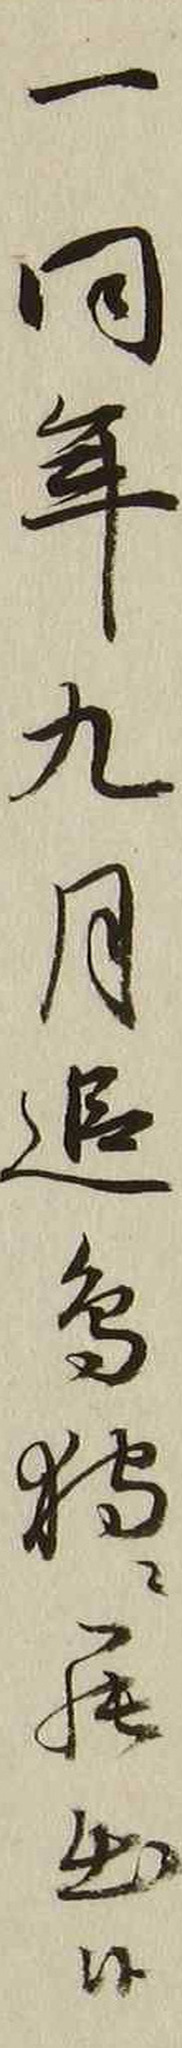一同年九月追鳥狩ニ罷り出で候
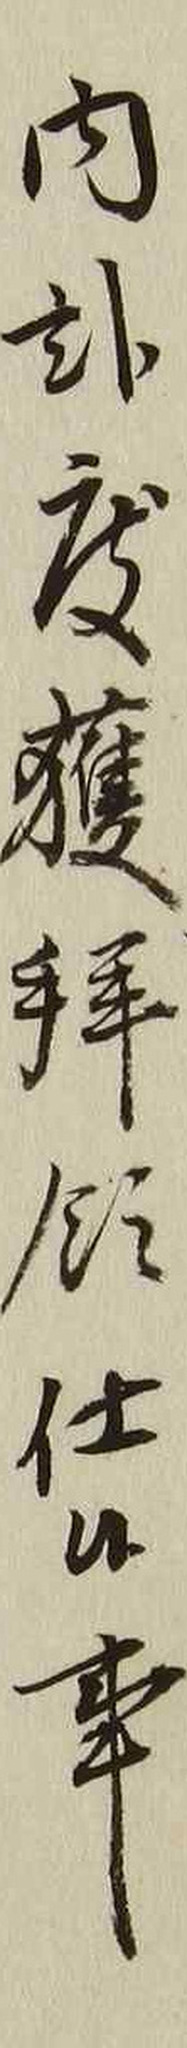内弐度獲拝領仕り候事
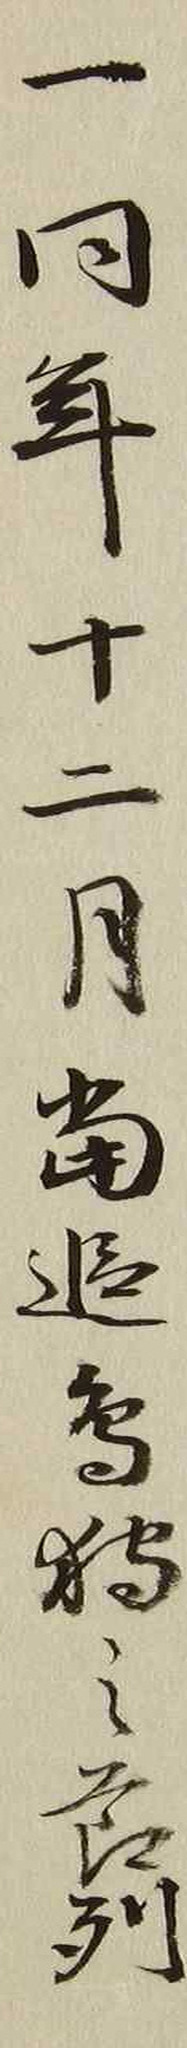一同年十二月当追鳥狩之節列
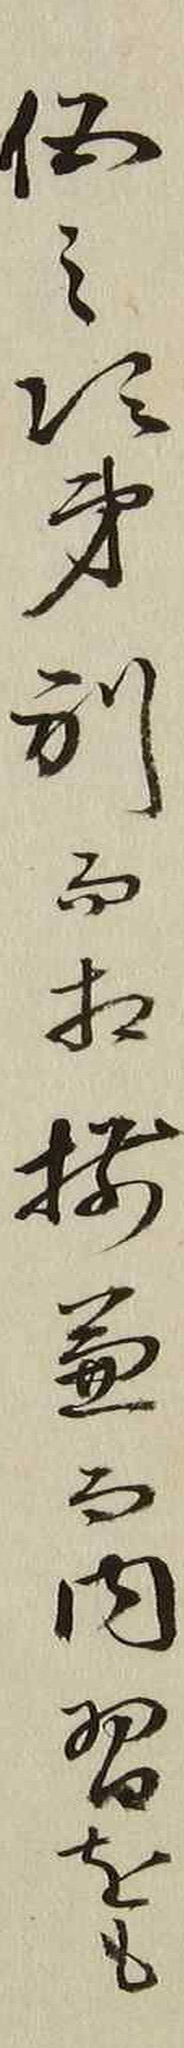伍之次第別して相揃え兼ねて内習をも
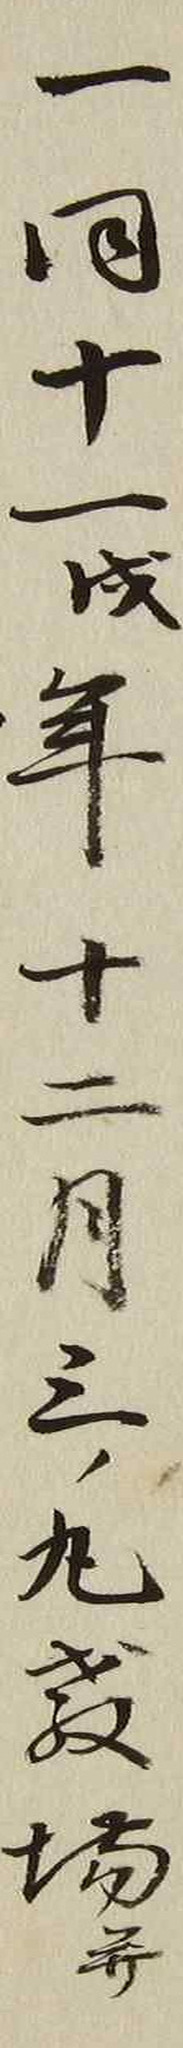一同十一戌年十二月三ノ丸教場幷
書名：諸士系譜　巻之19　い之部19
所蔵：会津若松市立会津図書館
